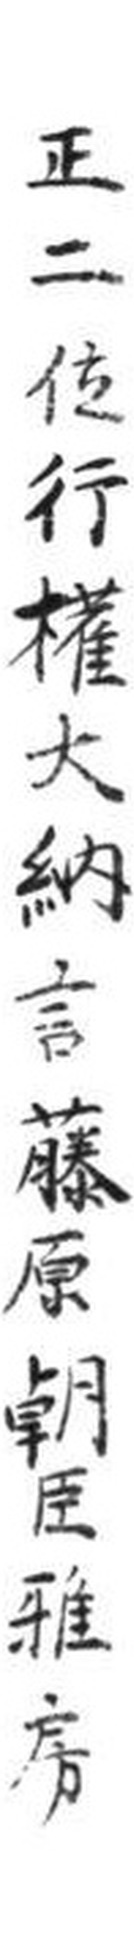正二位行権大納言藤原朝臣雅房
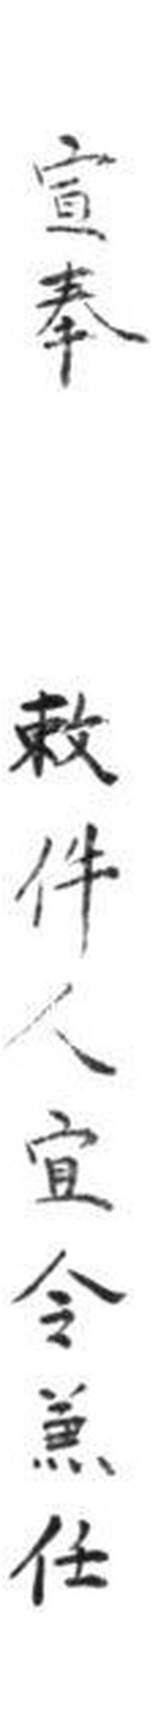宣奉勅件人宜令兼任
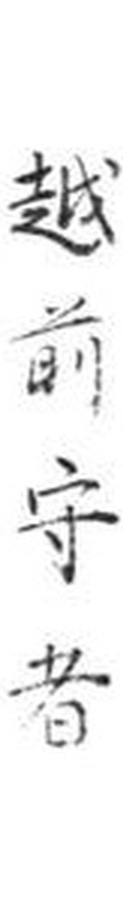越前守者
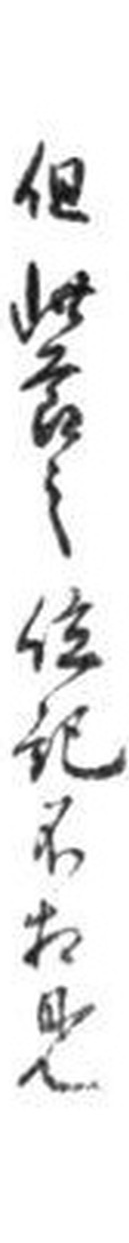但此節之位記不相見
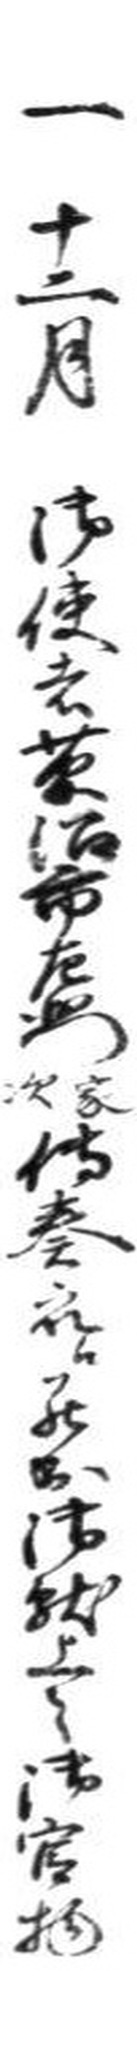一十二月御使者菅沼市左衛門家次伝奏衆江罷出御献上之御官物
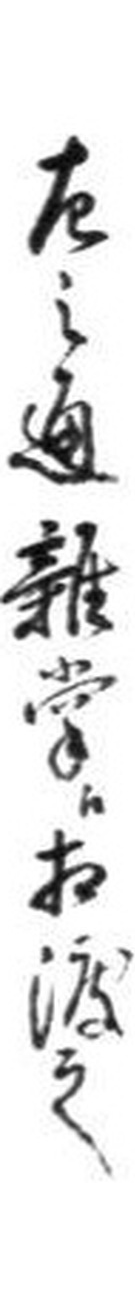左之通雑掌江相渡之
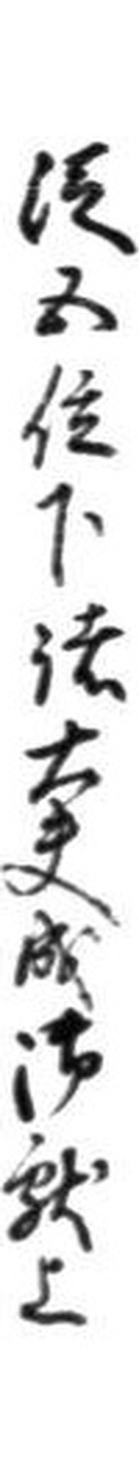従五位下諸大夫成御献上
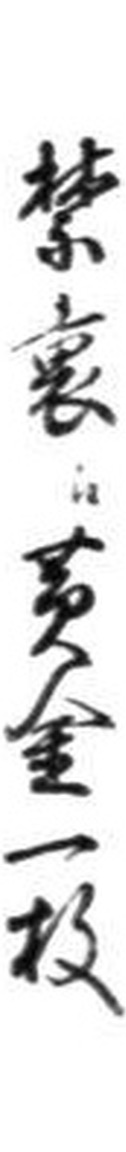禁裏江黄金一枚
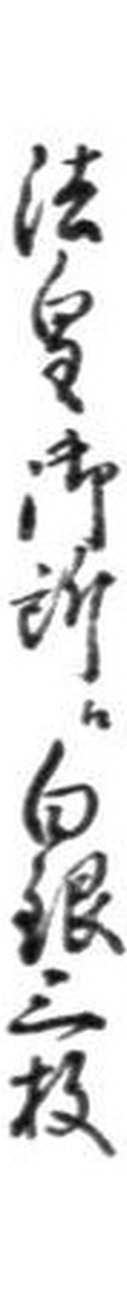法皇御所江白銀三枚
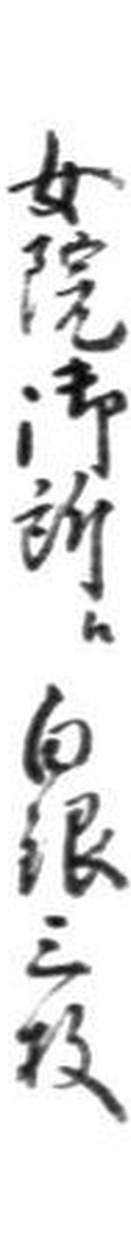女院御所江白銀三枚
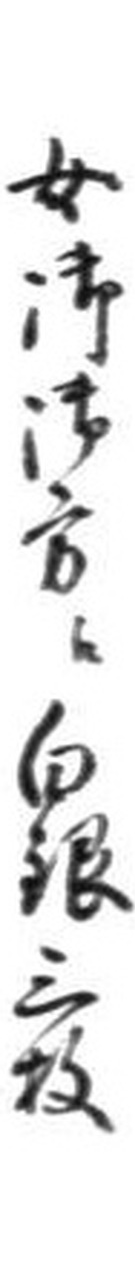女御御方江白銀三枚
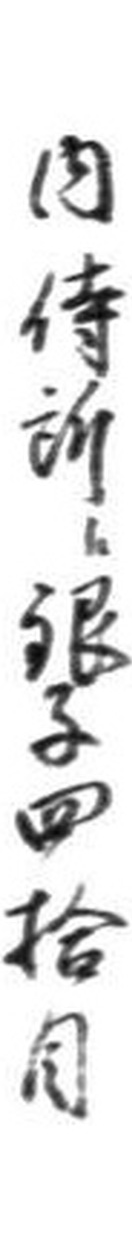内侍所江銀子四拾目
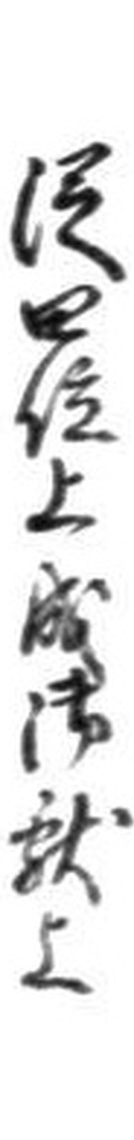従四位上成御献上
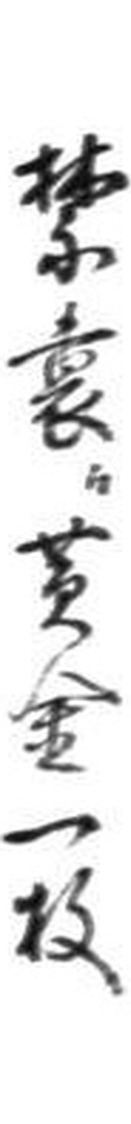禁裏江黄金一枚
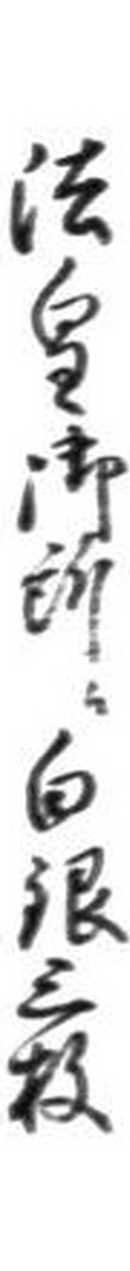法皇御所江白銀三枚

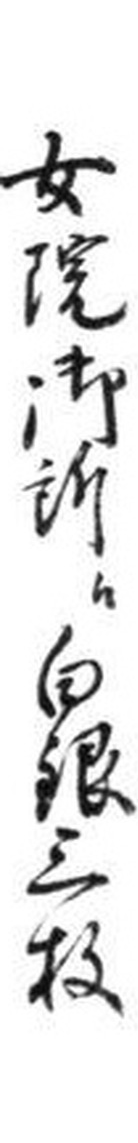女院御所江白銀三枚
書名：家譜 十三 綱昌公 従寛文元年到延宝五年
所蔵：福井県文書館 Fukui Prefectural Archives
